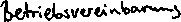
Betriebsvereinbarung
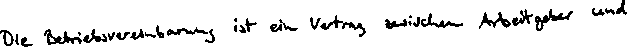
Die Betriebsvereinbarung ist ein Vertrag zwischen Arbeitgeber und
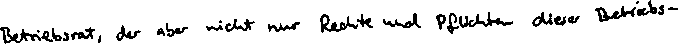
Betriebsrat, der aber nicht nur Rechte undPflichten dieser Betriebs-
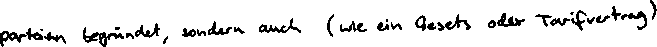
parteien begründet, sondern auch (wie ein Gesetz oder Tarifvertrag)
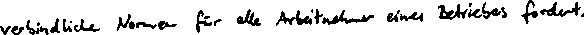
verbindliche Normen für alle Arbeitnehmer eines Betriebes formuliert.
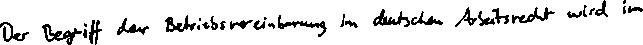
Der Begriff der Betriebsvereinbarung im deutschen Arbeitsrecht wird im
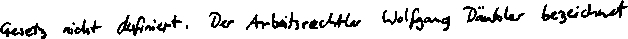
Gesetz nicht definiert. Der Arbeitsrechtler Wolfgang Däubler bezeichnet
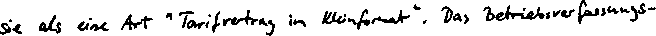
sie als eine Art "Tarifvertrag im Kleinformat". Das Betriebsverfassungs-
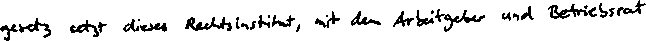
gesetz setzt dieses Rechtsinstitut, mit dem Arbeitgeber und Betriebsrat
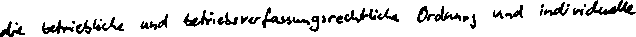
die betriebliche und betriebsverfassungsrechtliche Ordnung und individuelle
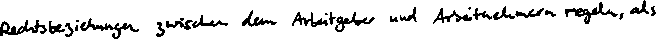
Rechtsbeziehungen zwischen Arbeitgeber und Arbeitnehmern regeln, als
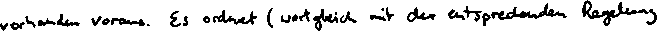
vorhanden voraus. Es ordnet (wortgleich mit der entsprechenden Regelung
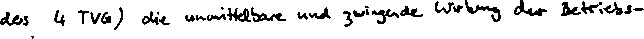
des 4 TVG) die unmittelbare und zwingende Wirkung der Betriebs-
